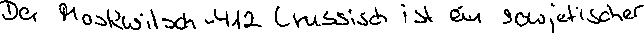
Der Moskwitsch-412 (russisch ist ein sowjetischer
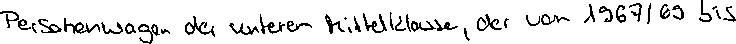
Personenwagen der unteren Mittelklasse, der von 1967/69 bis
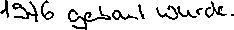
1976 gebaut wurde.
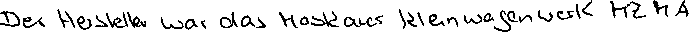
Der Hersteller war das Moskauer Kleinwagenwerk MZMA
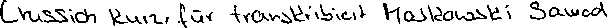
(russisch kurz für transkribiert Moskowski Sawod
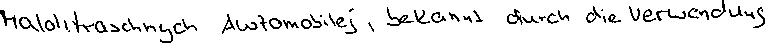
Malolitraschnych Awtomobilej, bekannt durch die Verwendung
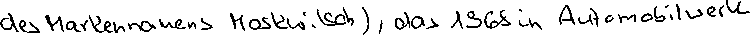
des Markennamens Moskwitsch), das 1968 in Automobilwerk
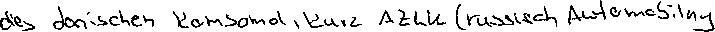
des Leninschen Komsomol, kurz AZLK (russisch Awtomobilny
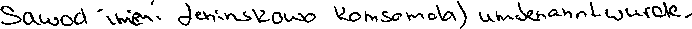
sawod imeni Leninskowo komsomola) umbenannt wurde.
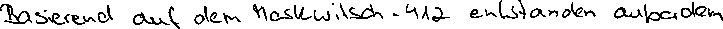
Basierend auf dem Moskwitsch-412 entstanden außerdem
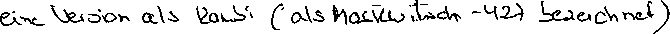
eine Version als Kombi (als Moskwitsch-427 bezeichnet)
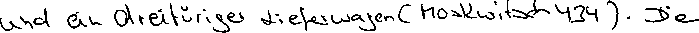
und ein dreitüriger Lieferwagen (Moskwitsch-434). Die
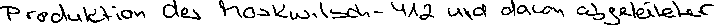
Produktion des Moskwitsch-412 und davon abgeleiteter
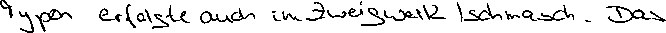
Typen erfolgte auch im Zweigwerk Ischmasch. Das
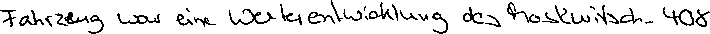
Fahrzeug war eine Weiterentwicklung des Moskwitsch-408
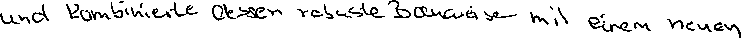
und kombinierte dessen robuste Bauweise mit einem neuen
